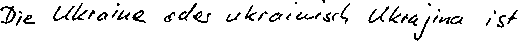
Die Ukraine oder ukrainisch Ukrajina ist
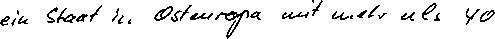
ein Staat in Osteuropa mit mehr als 40
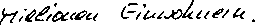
Millionen Einwohnern.
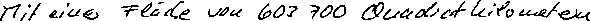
Mit einer Fläche von 603.700 Quadratkilometern
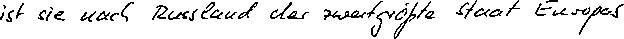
ist sie nach Russland der zweitgrößte Staat Europas
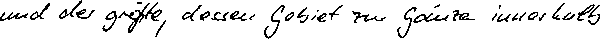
und der größte, dessen Gebiet zur Gänze innerhalb
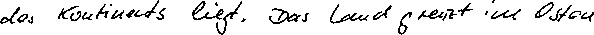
des Kontinents liegt. Das Land grenzt im Osten
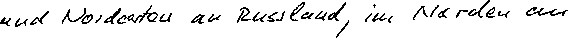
und Nordosten an Russland, im Norden an
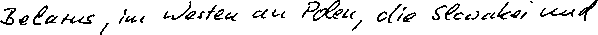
Belarus, im Westen an Polen, die Slowakei und
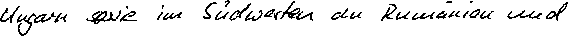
Ungarn sowie im Südwesten an Rumänien und
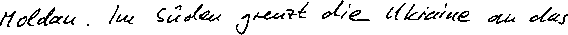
Moldau. Im Süden grenzt die Ukraine an das
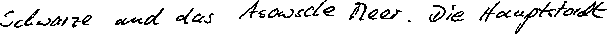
Schwarze und das Asowsche Meer. Die Hauptstadt
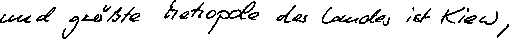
und größte Metropole des Landes ist Kiew,
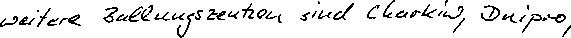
weitere Ballungszentren sind Charkiw, Dnipro,
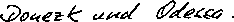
Donezk und Odessa.
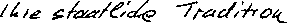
Ihre staatliche Tradition
